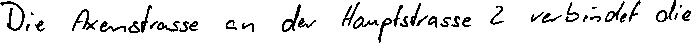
Die Axenstrasse an der Hauptstrasse 2 verbindet die
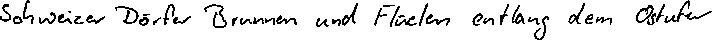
Schweizer Dörfer Brunnen und Flüelen entlang dem Ostufer
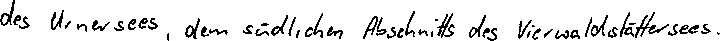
des Urnersees, dem südlichen Abschnitt des Vierwaldstättersees.
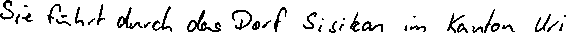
Sie führt durch das Dorf Sisikon im Kanton Uri
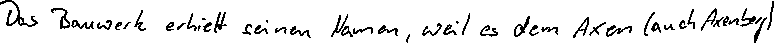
Das Bauwerk erhielt seinen Namen, weil es dem Axen (auch Axenberg)
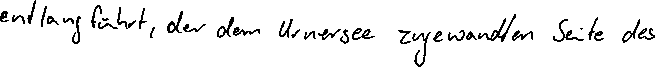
entlangführt, der dem Urnersee zugewandten Seite des
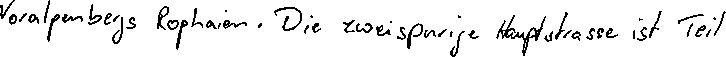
Voralpenbergs Rophaien. Die zweispurige Hauptstrasse ist Teil
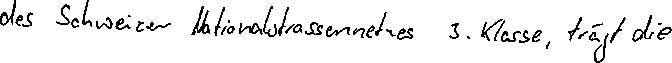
des Schweizer Nationalstrassennetzes 3. Klasse, trägt die
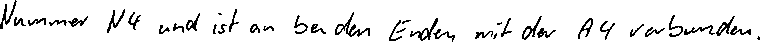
Nummer N4 und ist an beiden Enden mit der A4 verbunden.
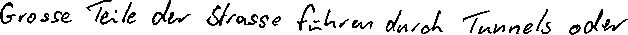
Grosse Teile der Strasse führen durch Tunnels oder
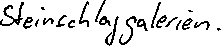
Steinschlaggalerien.
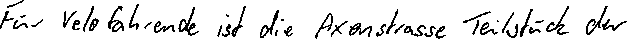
Für Velofahrende ist die Axenstrasse Teilstück der
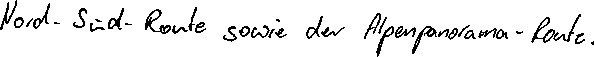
Nord-Süd-Route sowie der Alpenpanorama-Route.
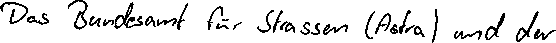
Das Bundesamt für Strassen (Astra) und der
